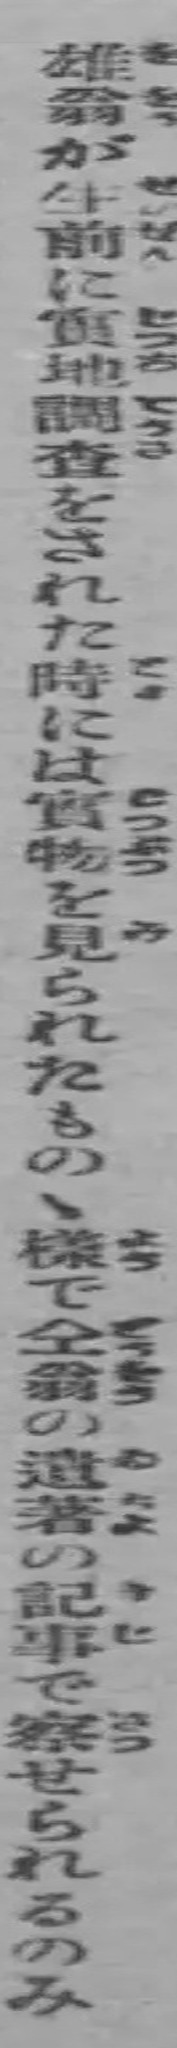雄翁が生前に実地調査をされた時には実物を見られたものゝ様で仝翁の遺著の記事で察せられるのみ
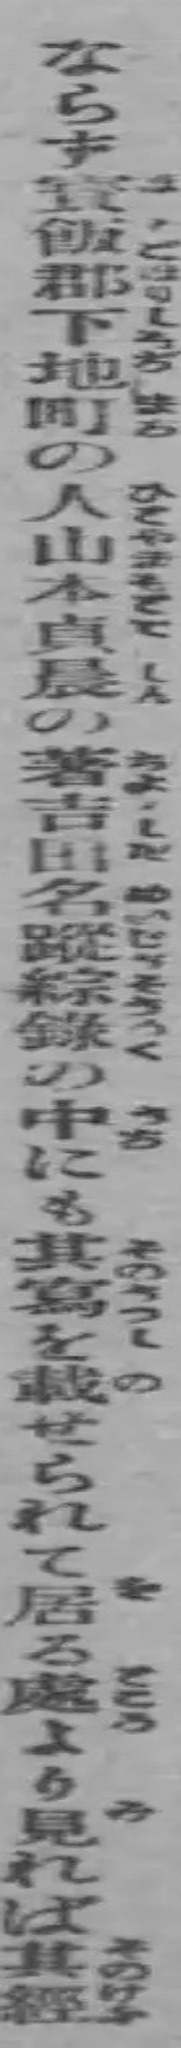ならず宝飯郡下地町の人山本貞晨の著吉田名蹤綜録の中にも其写を載せられて居る処より見れば其経
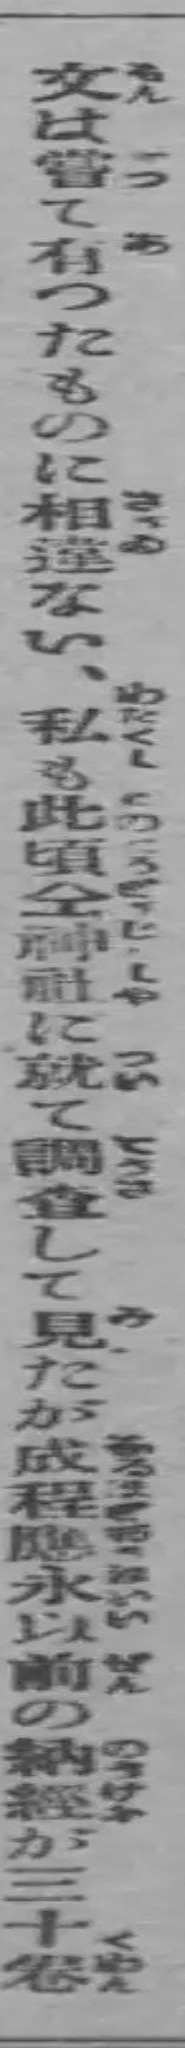文は嘗て有つたものに相違ない、私も此頃仝神社に就て調査して見たが成程応永以前の納経が三十巻
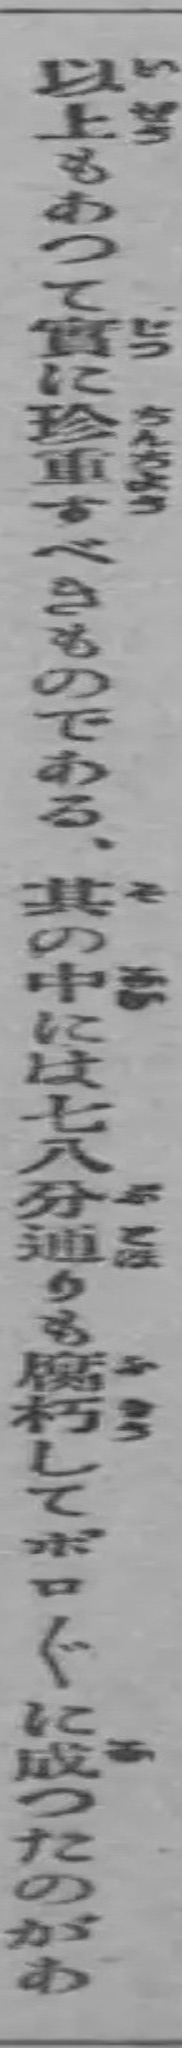以上もあつて実に珍重すべきものである、其の中には七八分通りも腐朽してボロ〴〵に成つたのがあ
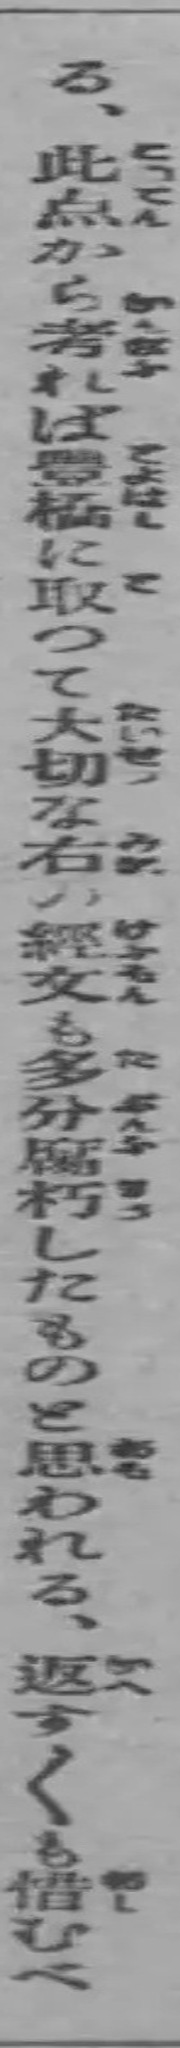る、此点から考れば豊橋に取つて大切な右の経文も多分腐朽したものと思われる、返す〳〵も惜むべ
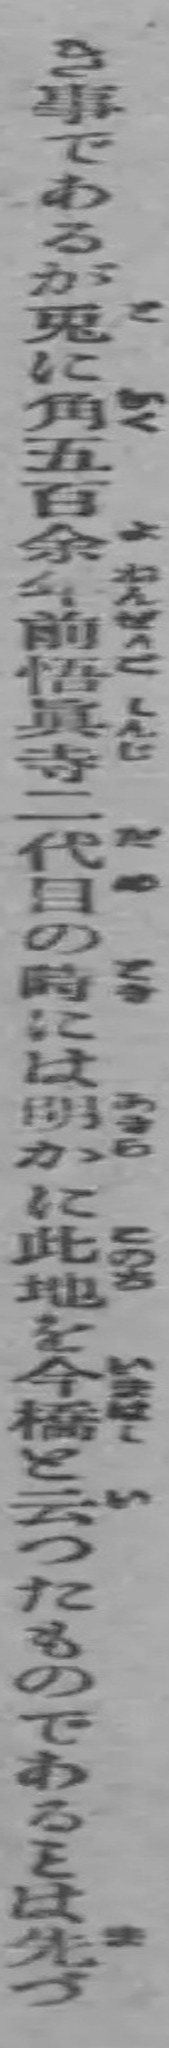き事であるが兎に角五百余年前悟眞寺二代目の時には明かに此地を今橋と云つたものであることは先づ
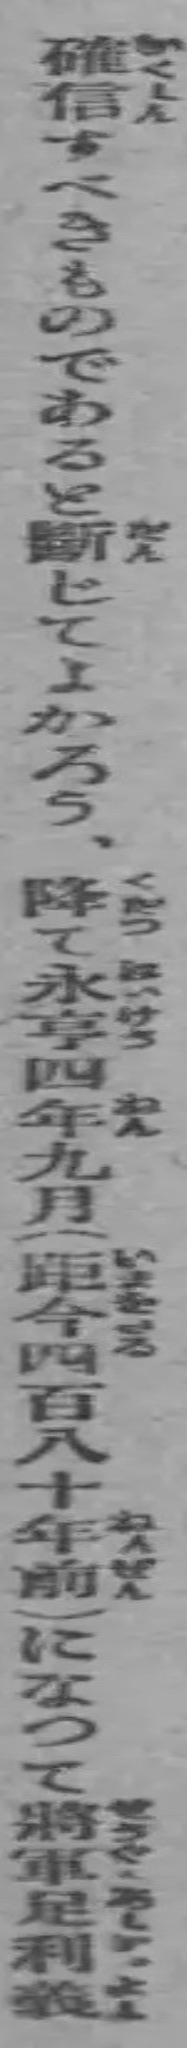確信すべきものであると断じてよかろう、降て永享四年九月(距今四百八十年前)になつて将軍足利義

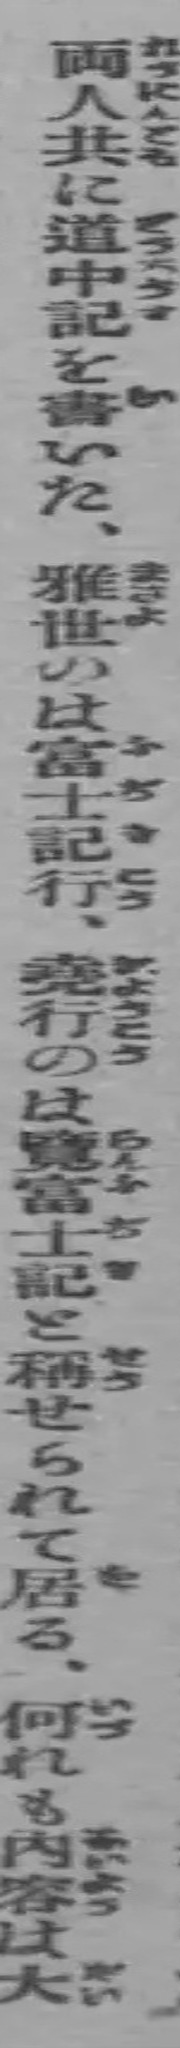両人共に道中記を書いた、雅世のは富士記行、堯行のは覧富士記と称せられて居る、何れも内容は大
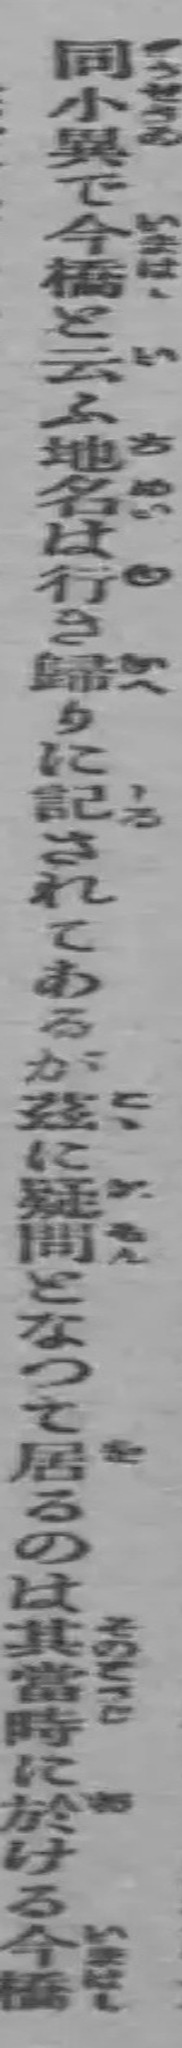同小異で今橋と云ふ地名は行き帰りに記されてあるが茲に疑問となつて居るのは其当時に於ける今橋
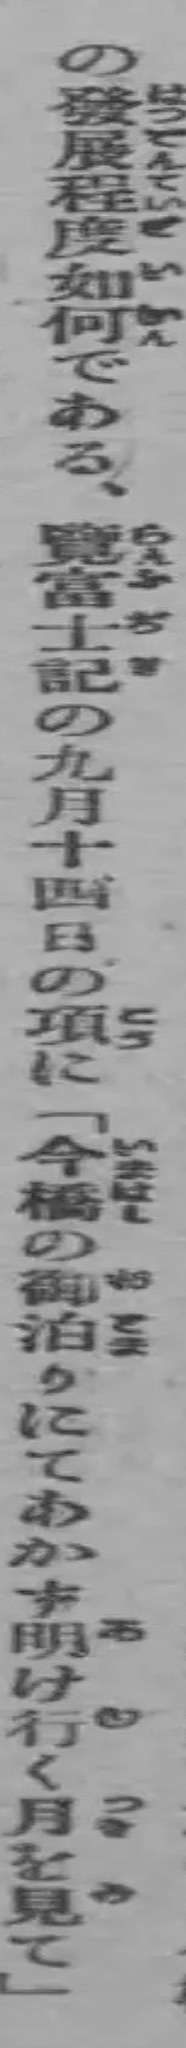の発展程度如何である、覧富士記の九月十四日の項に「今橋の御泊りにてあかす明け行く月を見て」
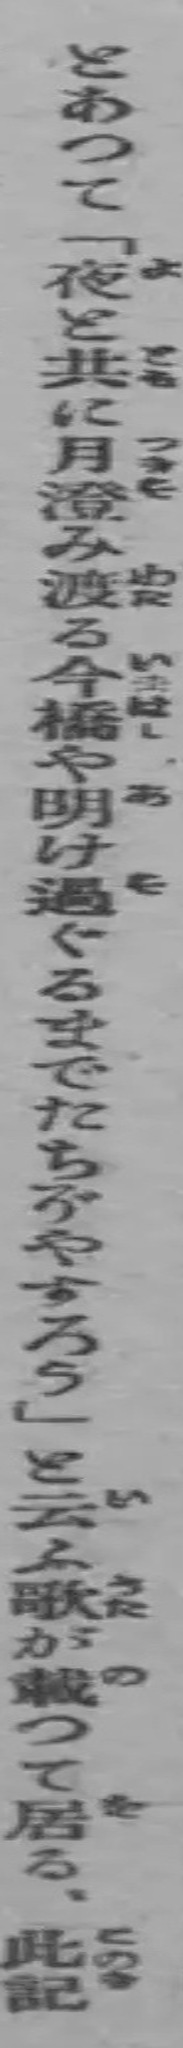とあつて「夜と共に月澄み渡る今橋や明け過ぐるまでたちぞやすろう」と云ふ歌が載つて居る、此記
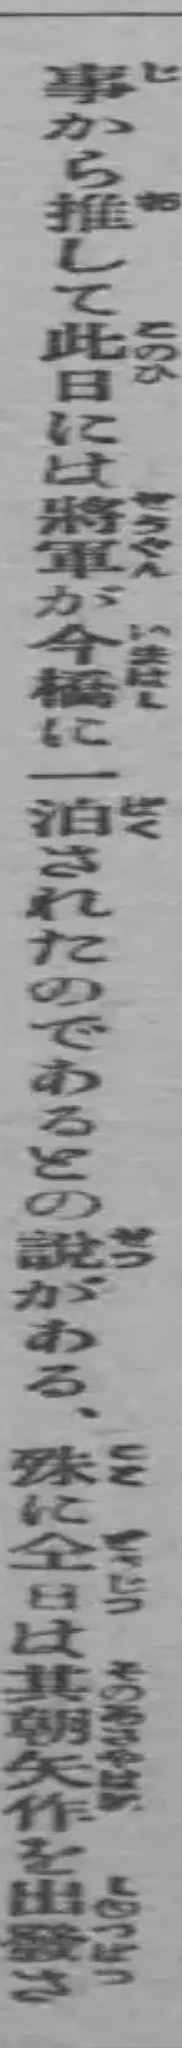事から推して此日には将軍が今橋に一泊されたのであるとの説がある、殊に仝日は其朝矢作を出発さ
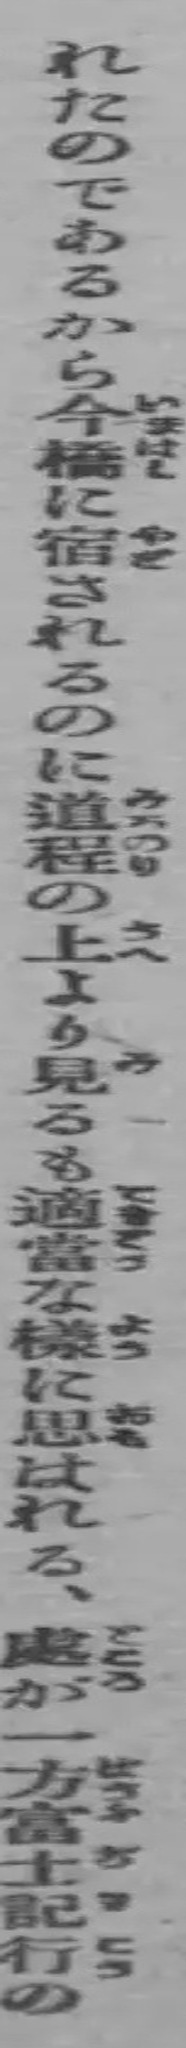れたのであるから今橋に宿されるのに道程の上より見るも適当な様に思はれる、処が一方富士記行の
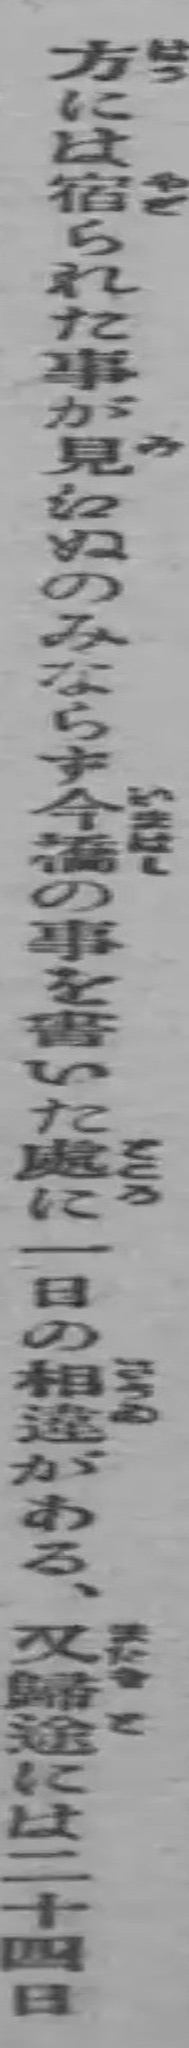方には宿られた事が見えぬのみならず今橋の事を書いた処に一日の相違がある、又帰途には二十四日
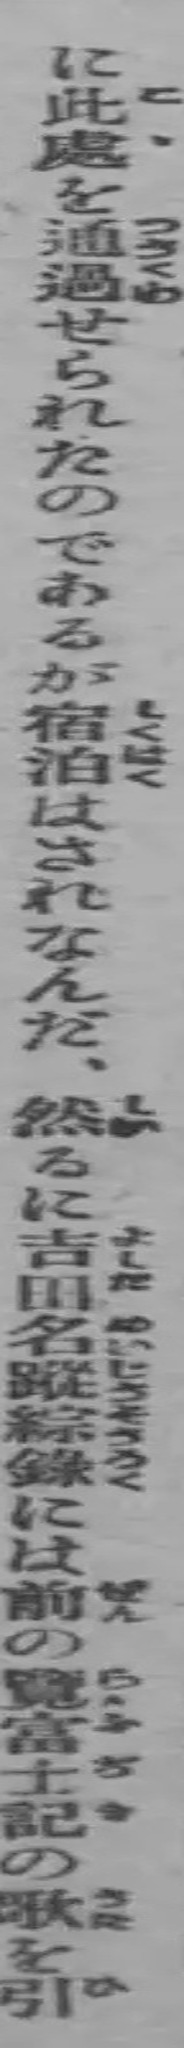に此処を通過せられたのであるが宿泊はされなんだ、然るに吉田名蹤綜録には前の覧富士記の歌を引
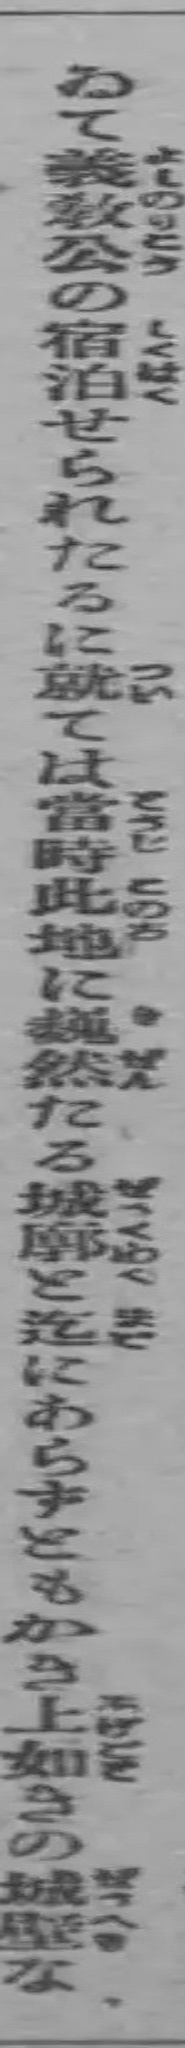ゐて義教公の宿泊せられたるに就ては当時此地に巍然たる城廓と迄にあらずともかき上如きの城壁な
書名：豊橋市史談
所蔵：国立国会図書館 National Diet Library, JAPAN
